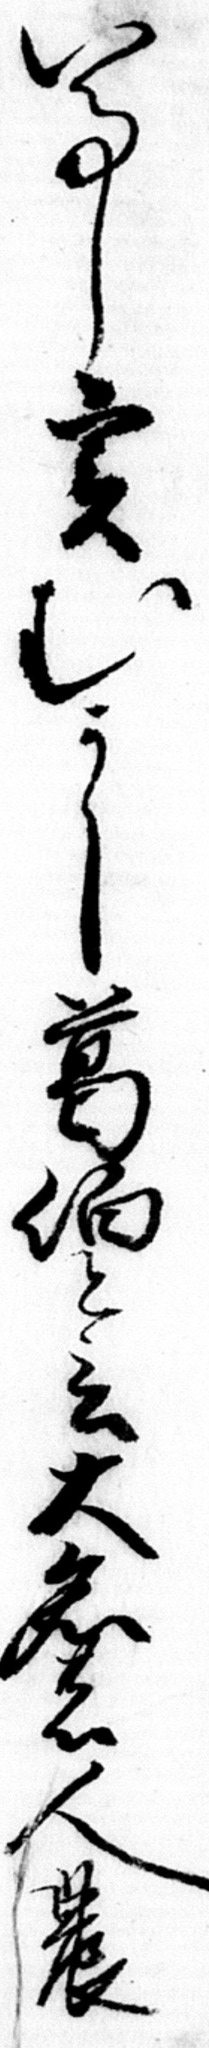いたし実むかし葛伯と言大名の人農
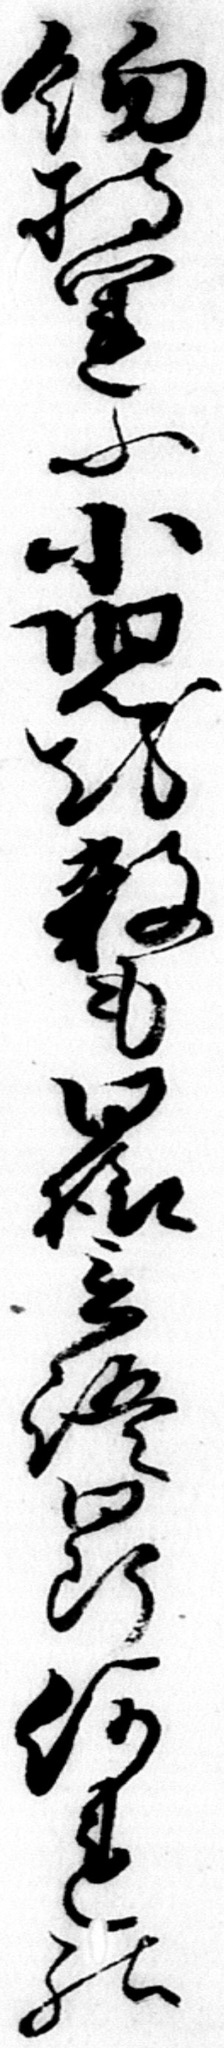餉持運ふ小児を殺も同様言語同断何れの
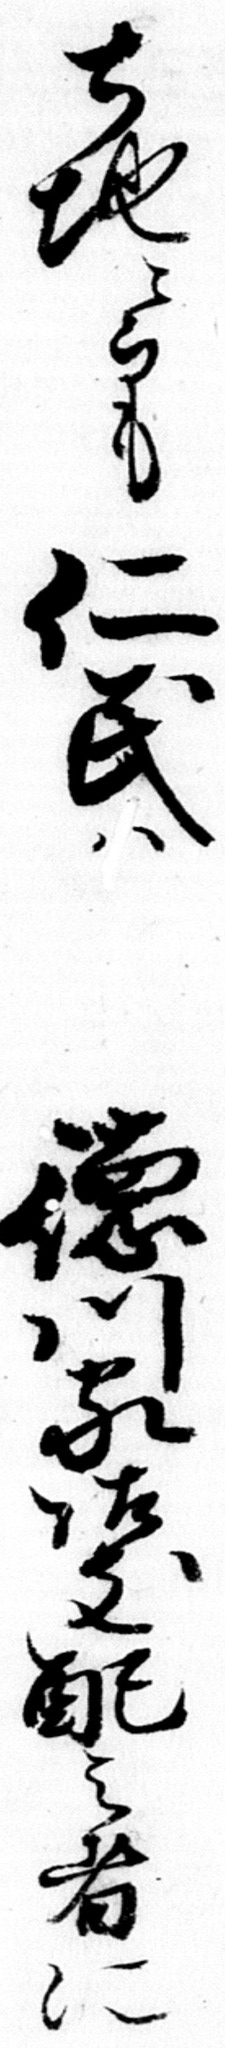土地に而も仁民は徳川家御支配之者に
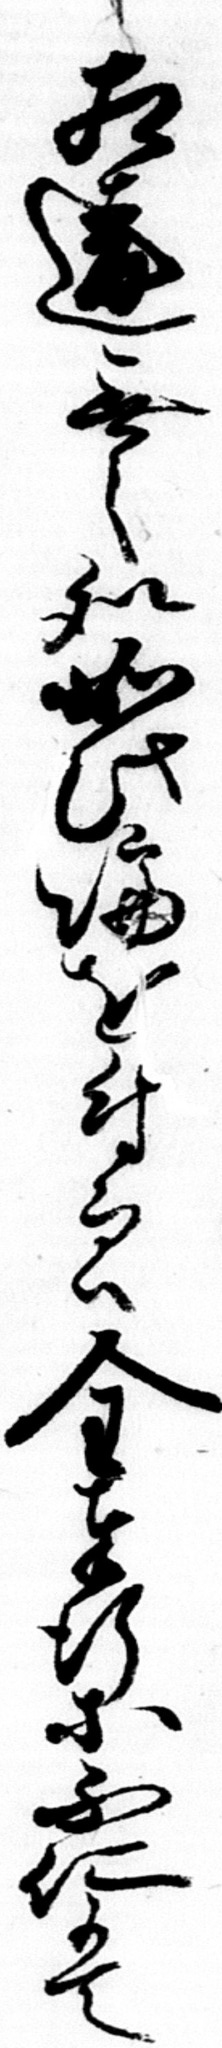相違無之処如此隔を付而は全奉行等不仁にて
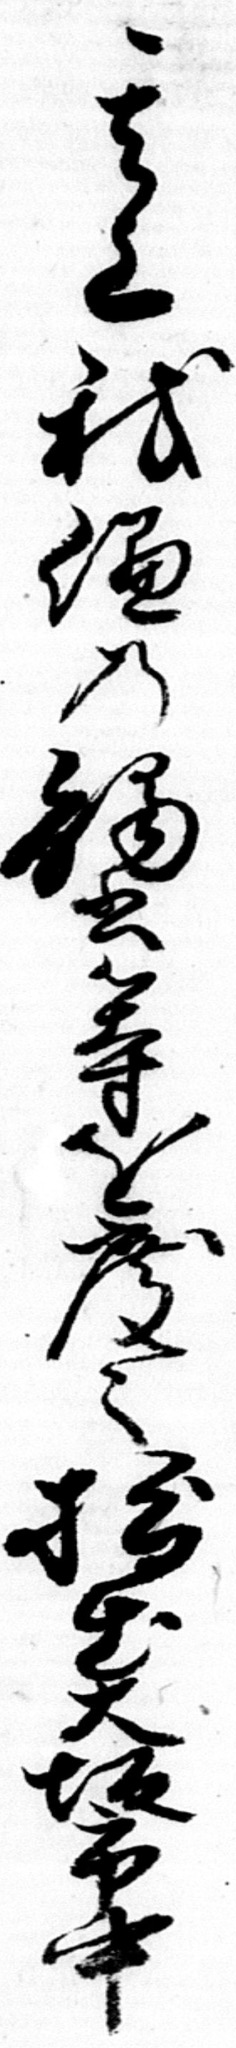其上我儘の触書等を度々指出大坂市中
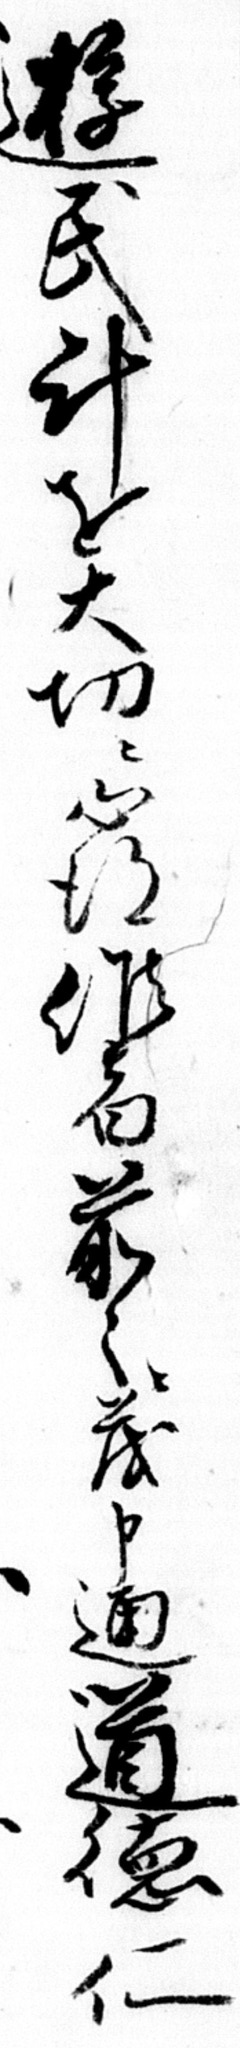遊民計を大切に心得候者は前々にも申通道徳仁
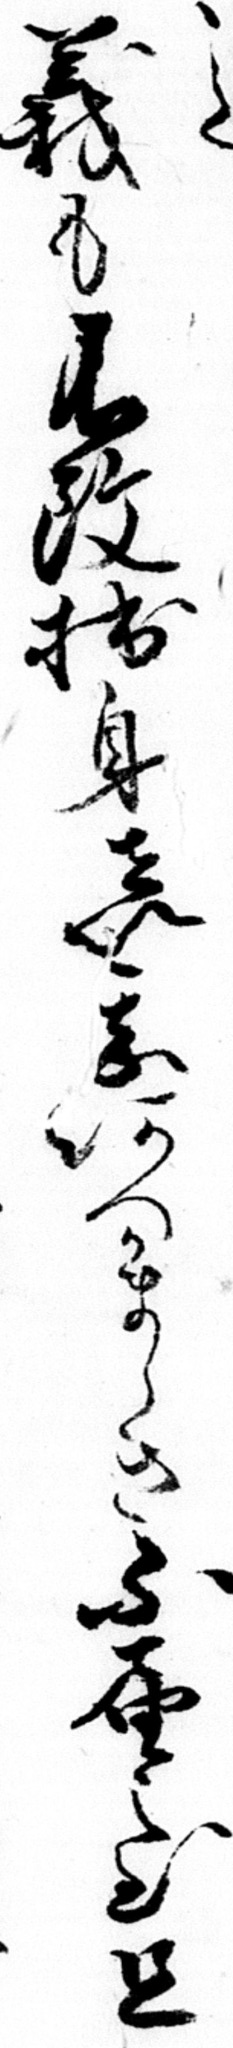義も不改拙身を以甚あつかましき不届之至且
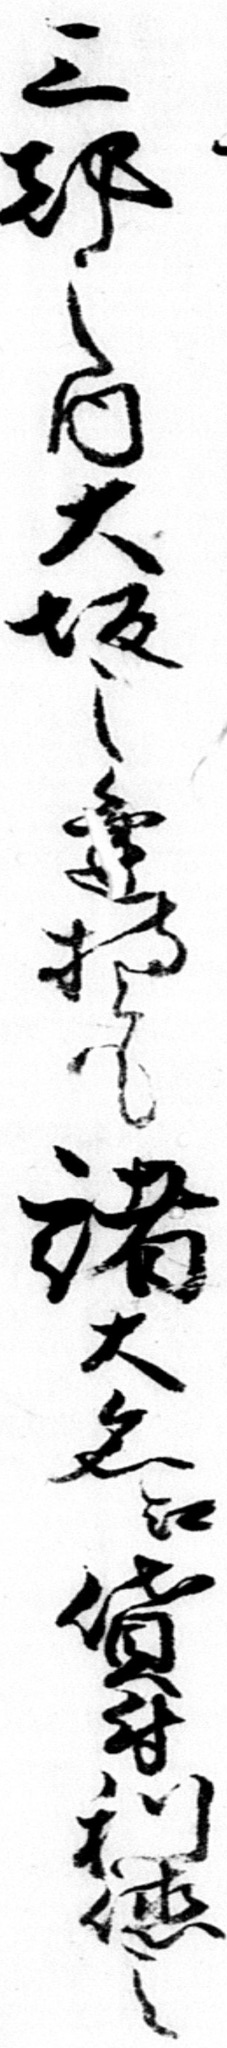三都之内大坂之金持とも諸大名え貸付利徳之
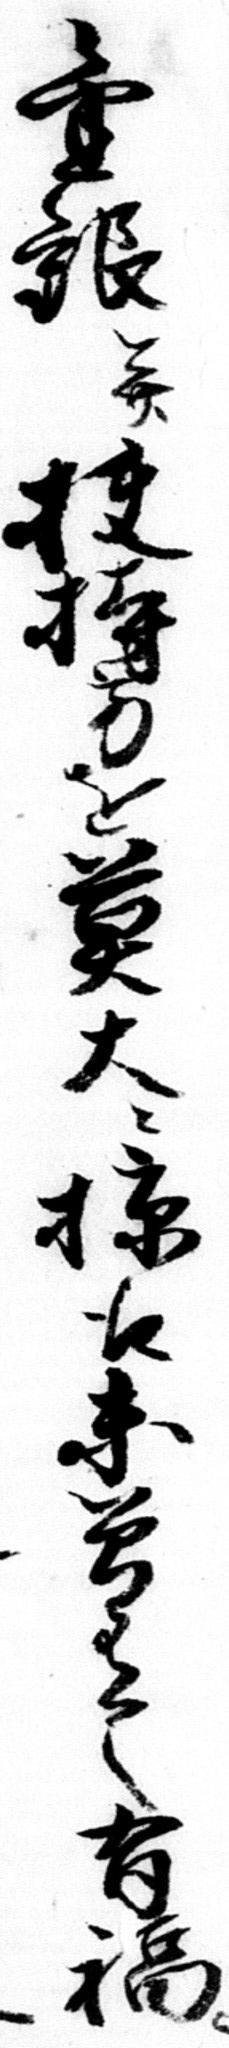金銀并扶持前を莫大に掠取未曾有之有福に
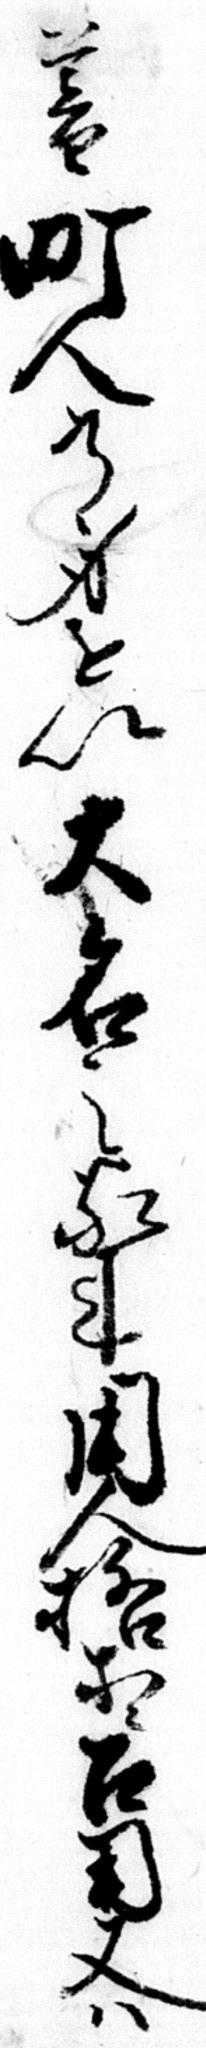暮町人之身を以大名之家来用人格等に召用又は
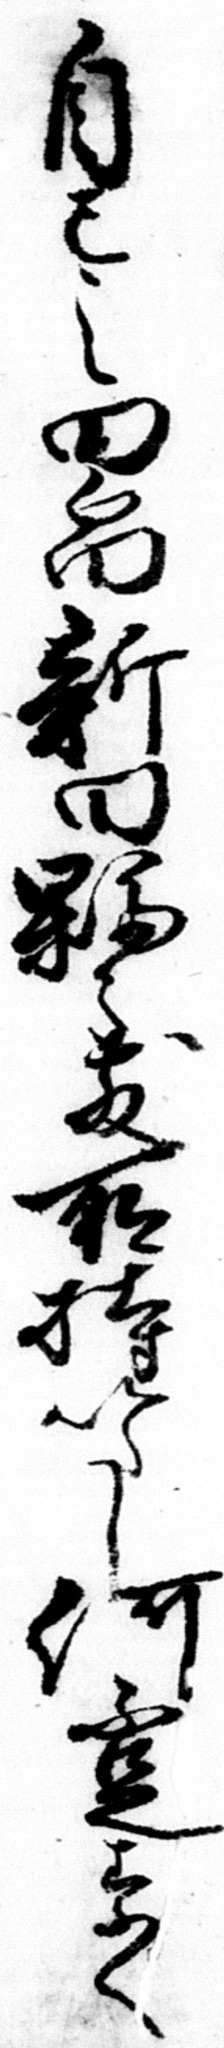自己之田畠新田夥敷所持いたし何不足なく

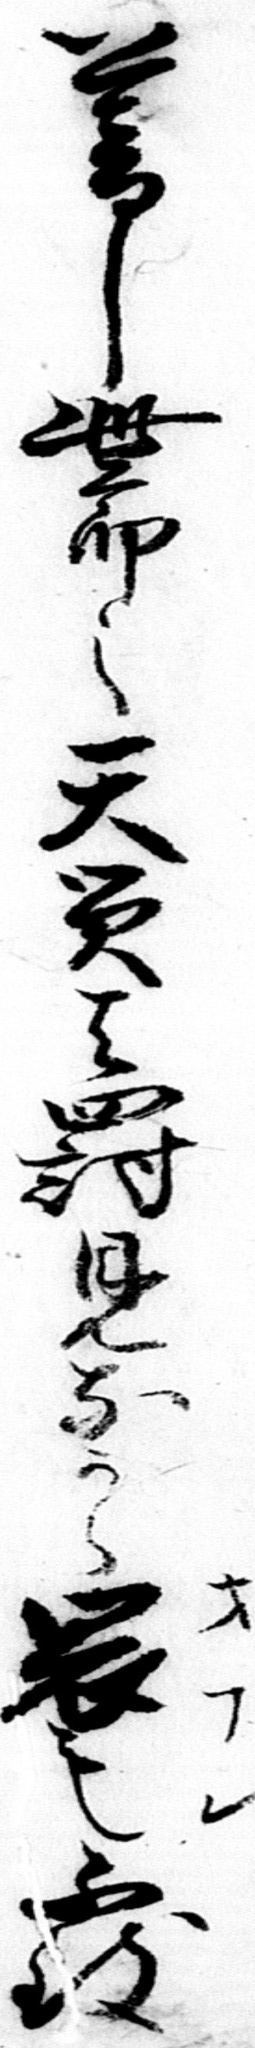暮し此節之天災天罰見なから畏も不致
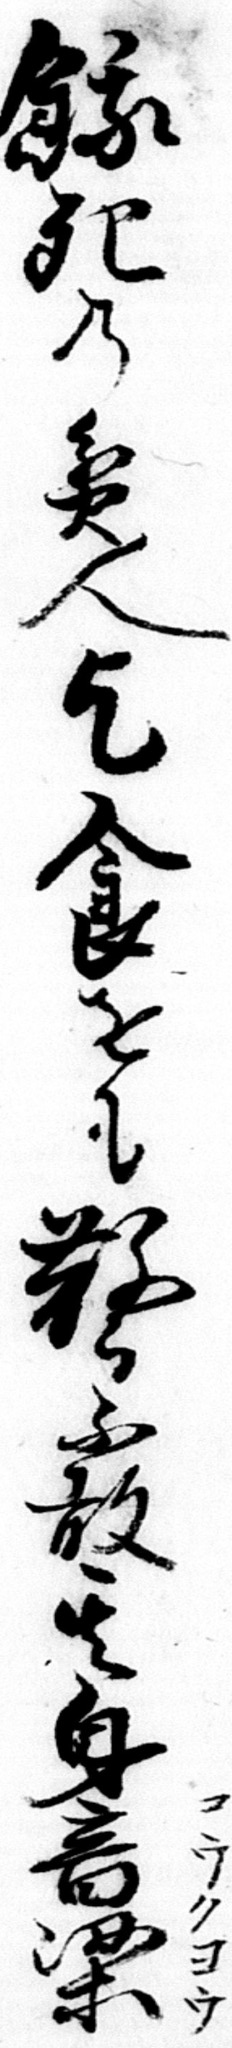餓死の貧人乞食をも敢而不救其身膏梁
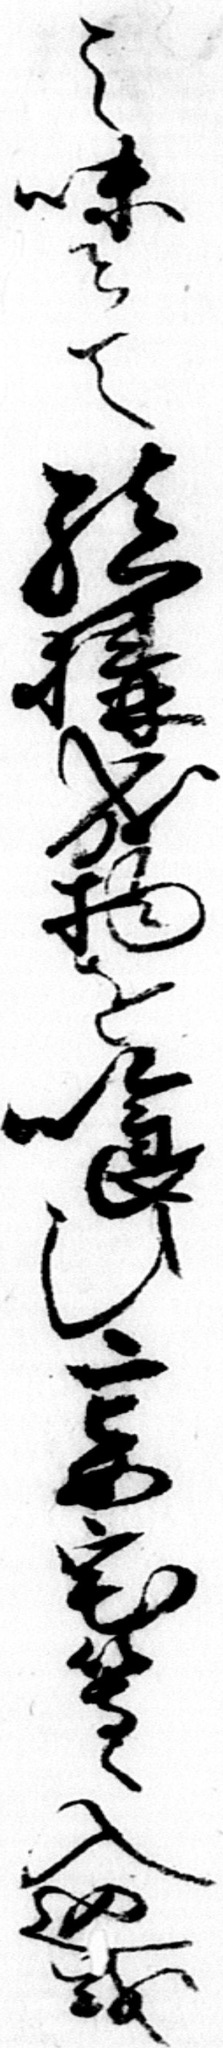之味とて結構成物を喰ひ妾宅等へ入込我
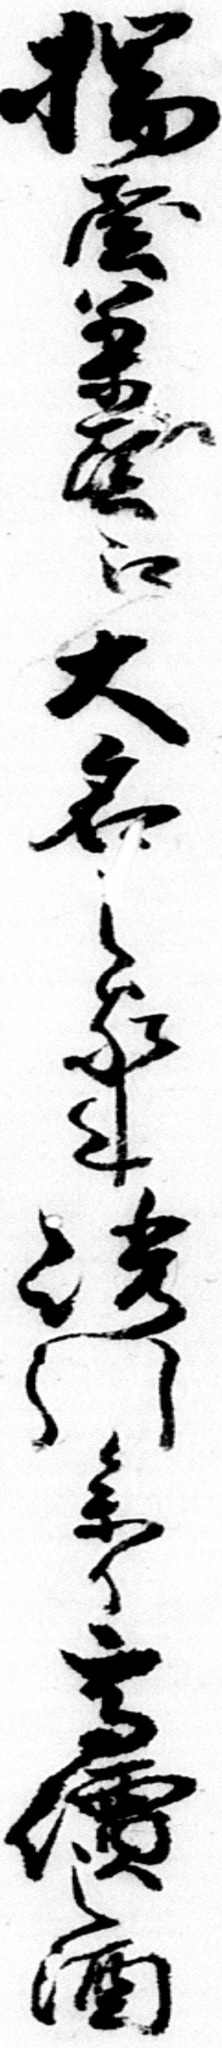揚屋茶屋え大名之家来誘引参り高価之酒
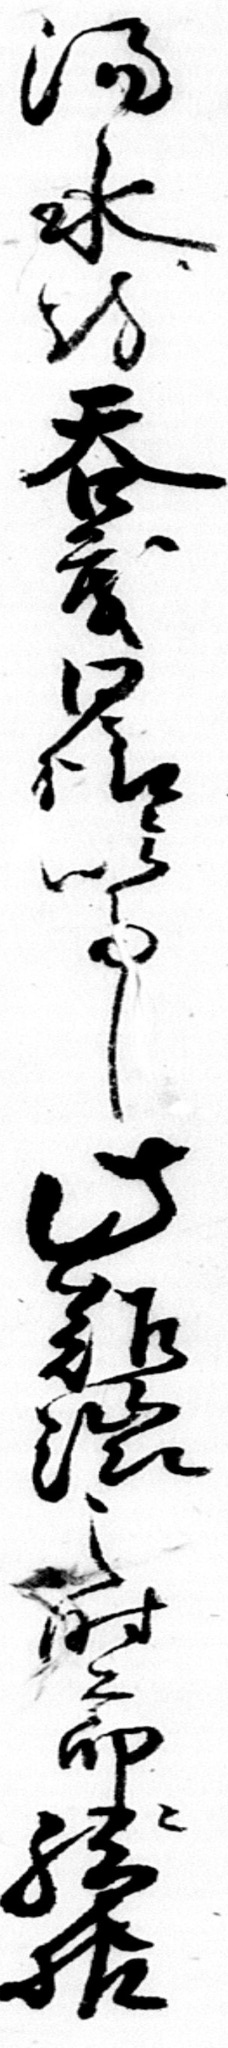湯水を呑も同様にいたし此難渋之時節に絹服
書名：大坂一件大塩平八郎存書
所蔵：徳島県立図書館
